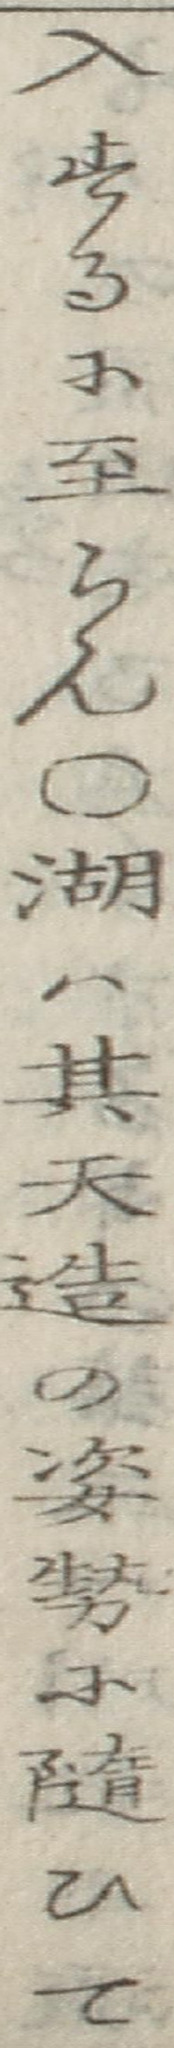入するに至らん〇湖は其天造の姿勢に随ひて
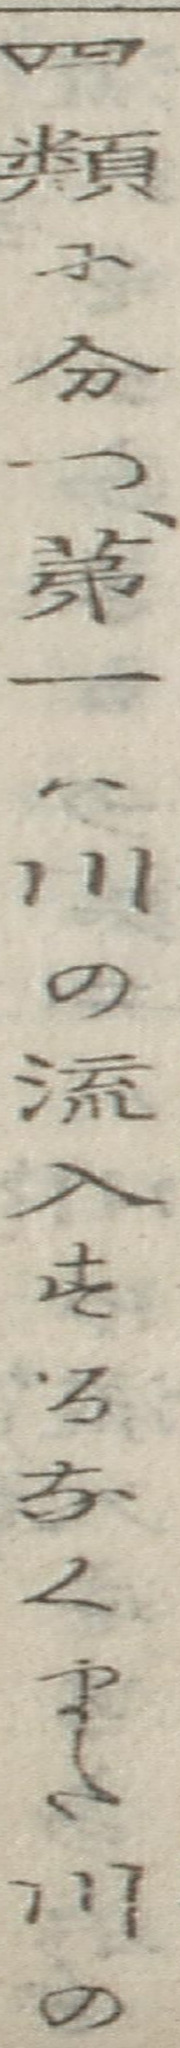四類に分つ、第一は川の流入するなくまた川の

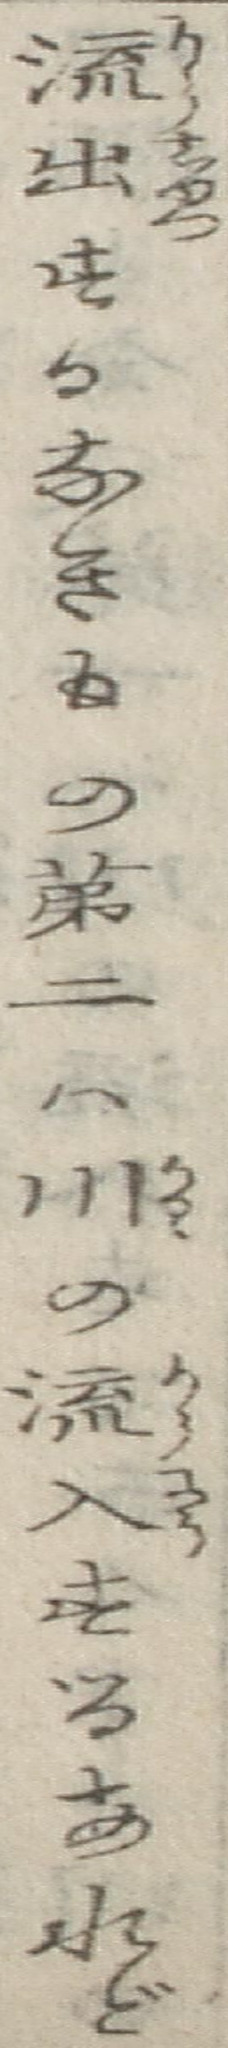流出するなきもの第二は川の流入するあれど
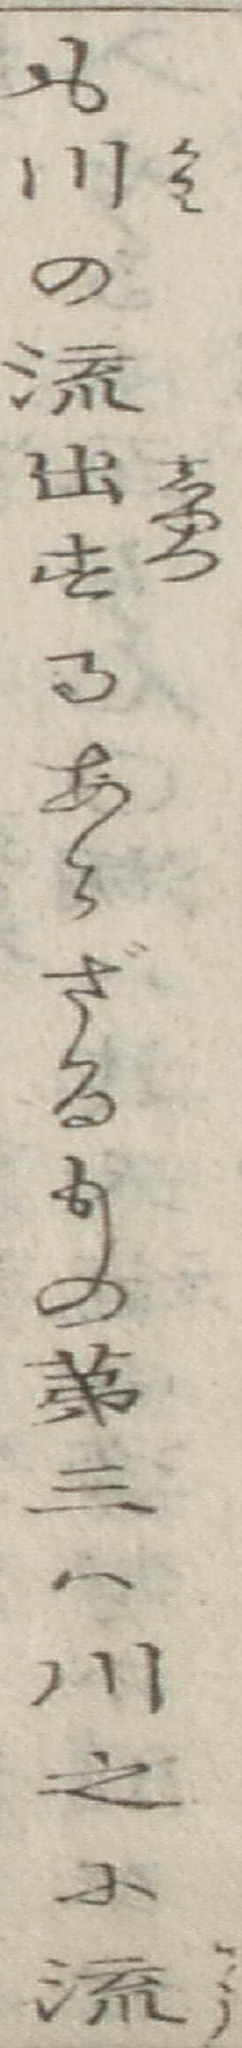も川の流出するあらざるもの第三は川之に流
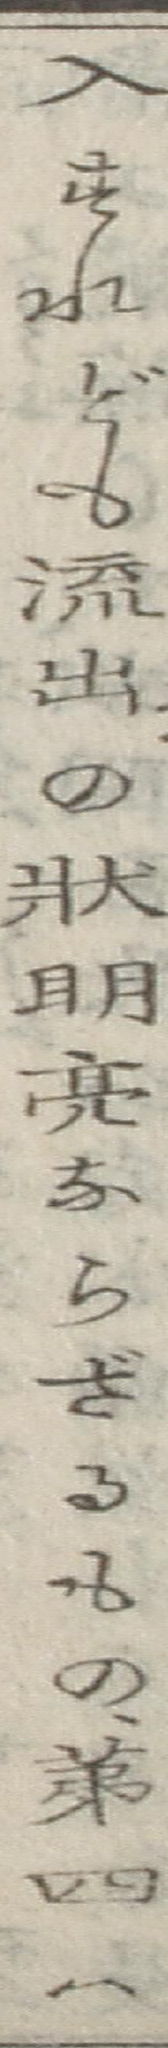入すれども流出の狀明亮ならざるもの、第四は
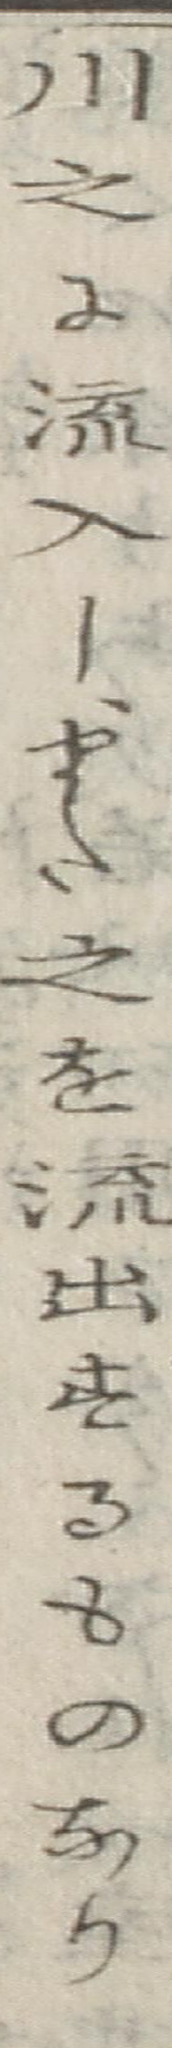川之に流入し、また之を流出するものなり
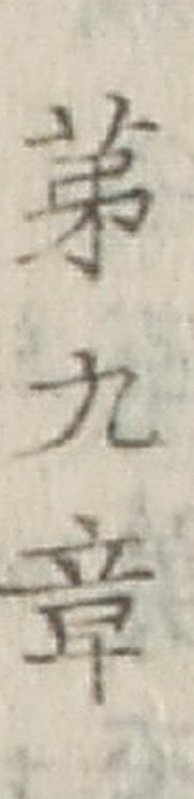第九章
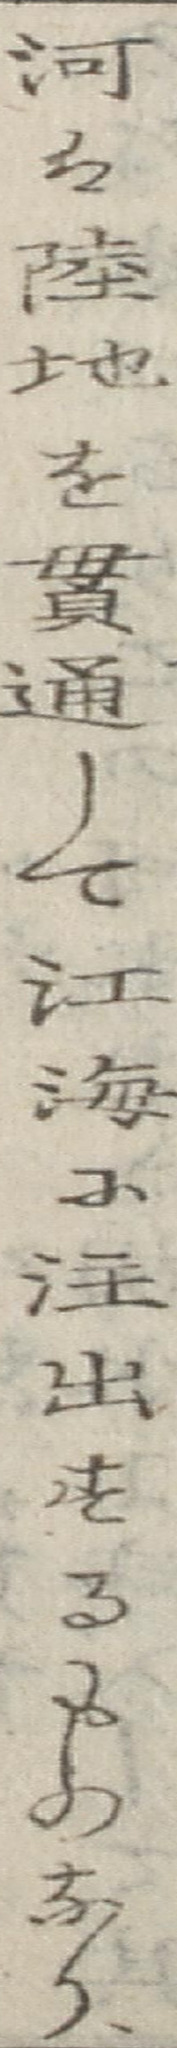河は陸地を貫通して江海に注出するものなり、
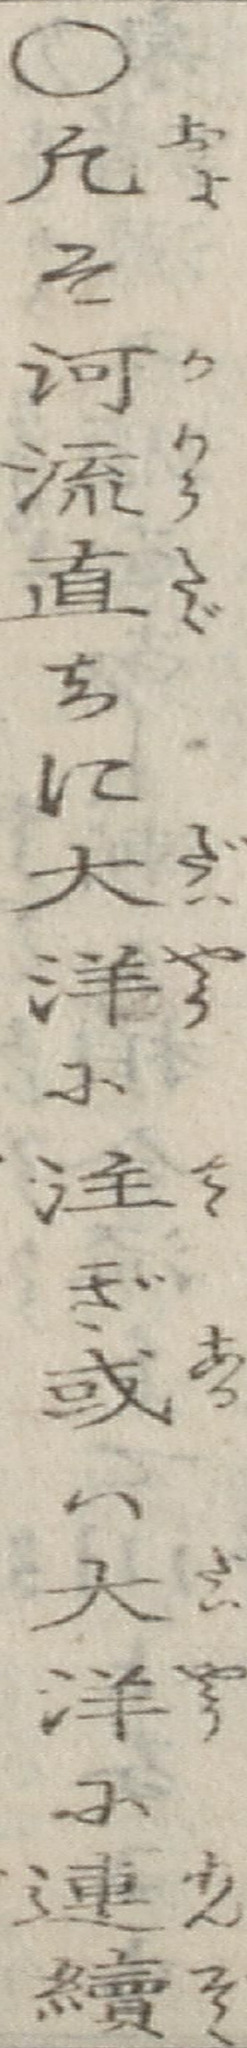〇凡そ河流直ちに大洋に注ぎ或は大洋に連続
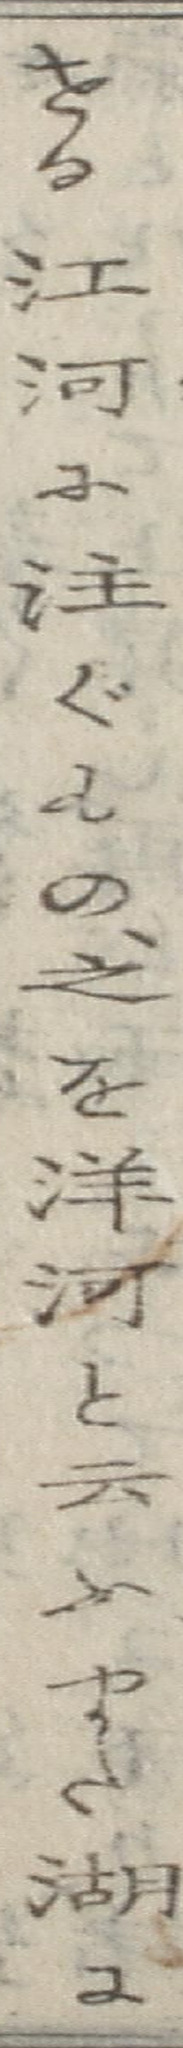せる江河に注ぐもの、之を洋河と云ふ、また湖に
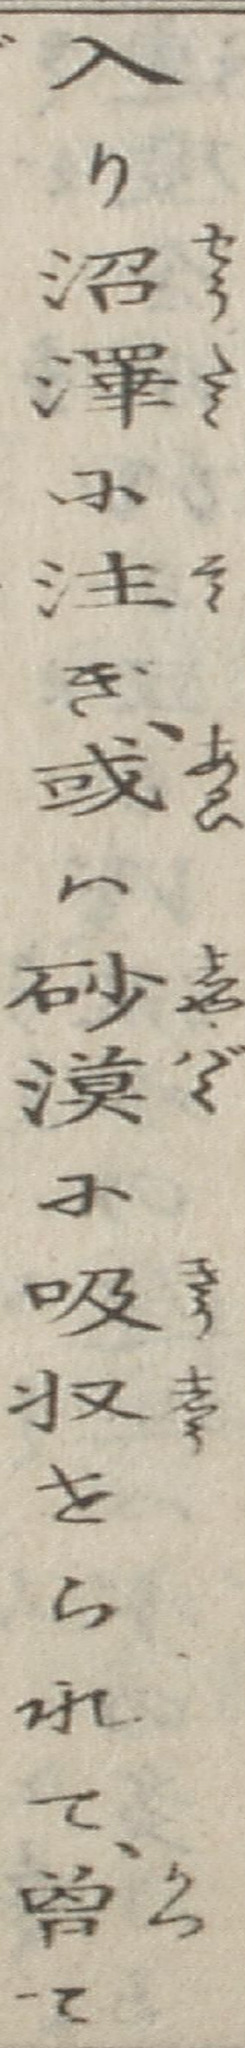入り沼澤に注ぎ、或は砂漠に吸収せられて、曽て
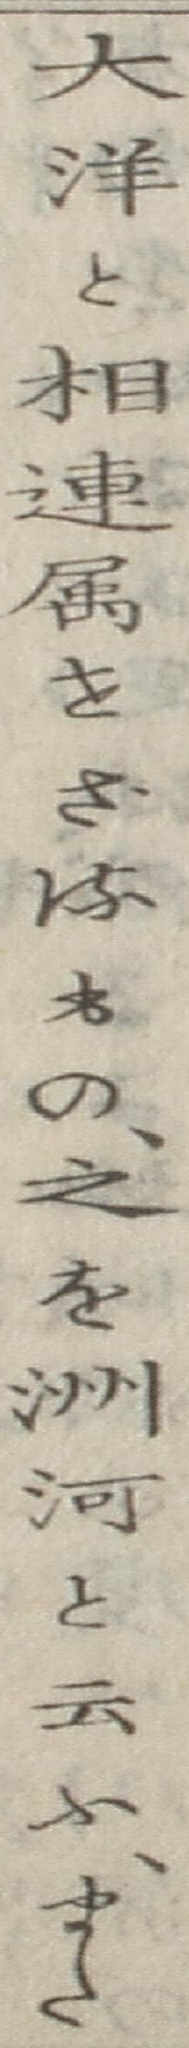大洋と相連属せざるもの、之を洲河と云ふ、また
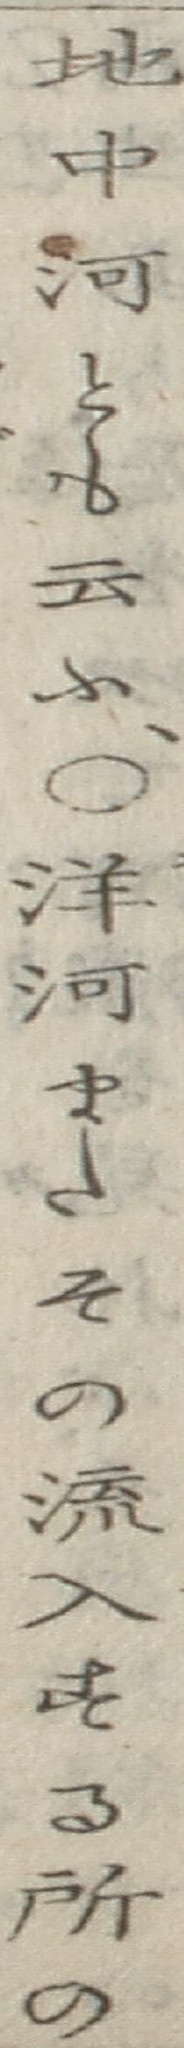地中河とも云ふ、〇洋河またその流入する所の
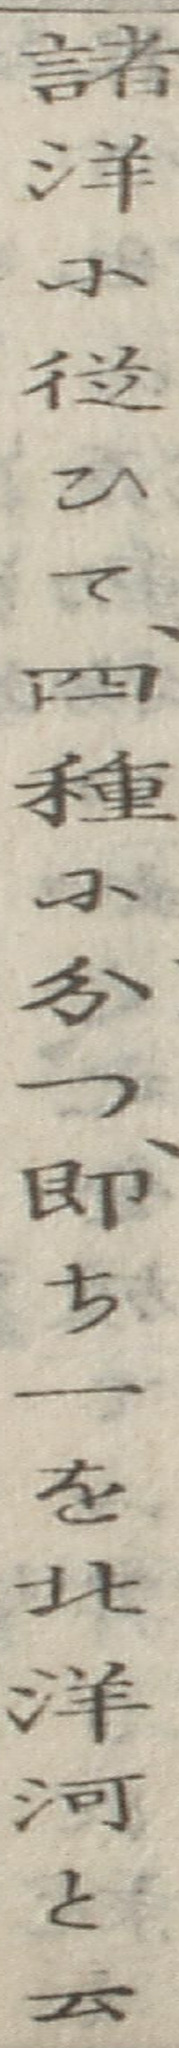諸洋に従ひて、四種に分つ、即ち一を北洋河と云
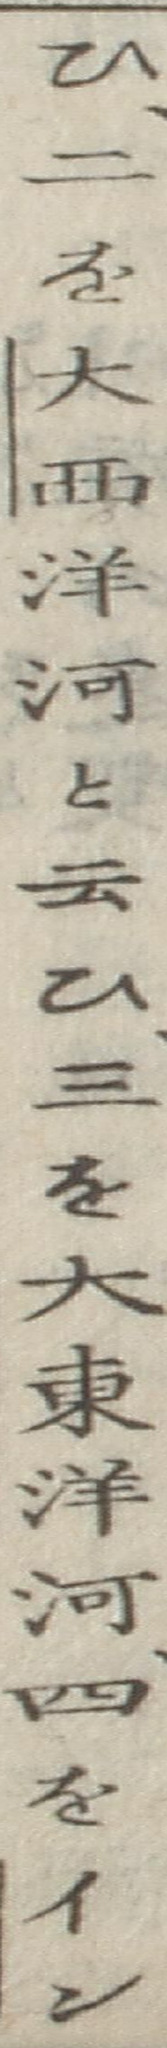ひ、二を大西洋河と云ひ、三を大東洋河、四をイン
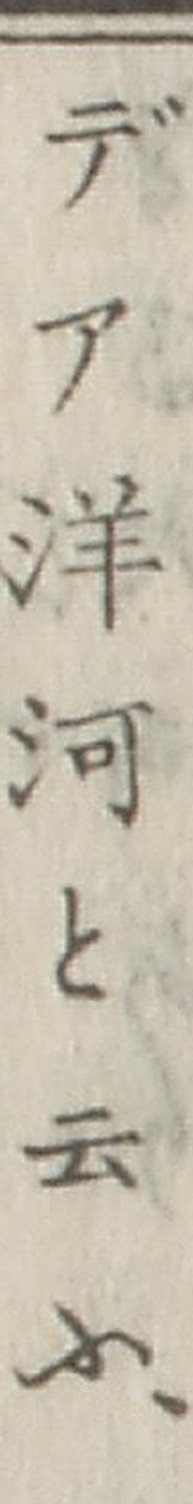デア洋河と云ふ、
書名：訓蒙　天然地理學　中
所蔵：東京大学地震研究所図書室 Earthquake Research Institute Library, The University of Tokyo, JAPAN
